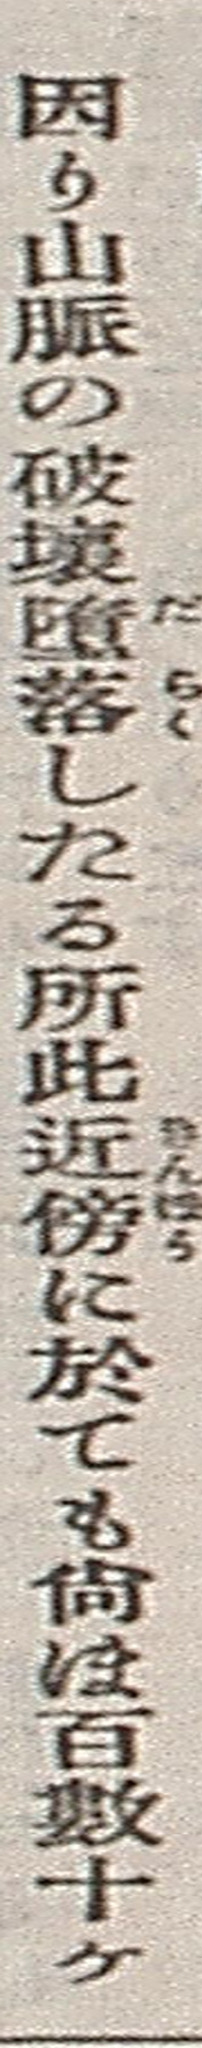因り山脈の破壊堕落したる所此近傍に於ても尚ほ百数十ケ
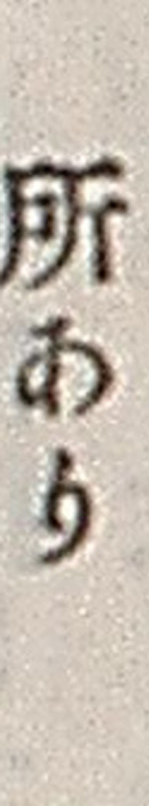所あり
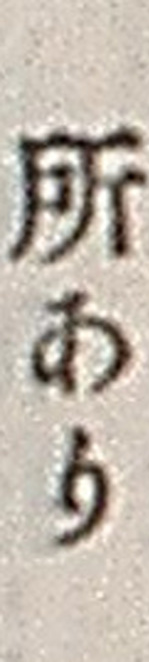所あり
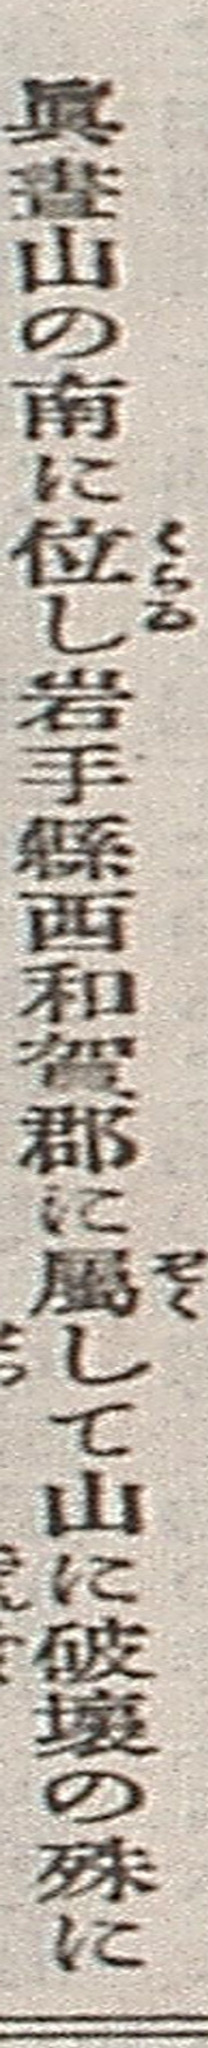真昼山の南に位し岩手県西和賀郡に属して山に破壊の殊に
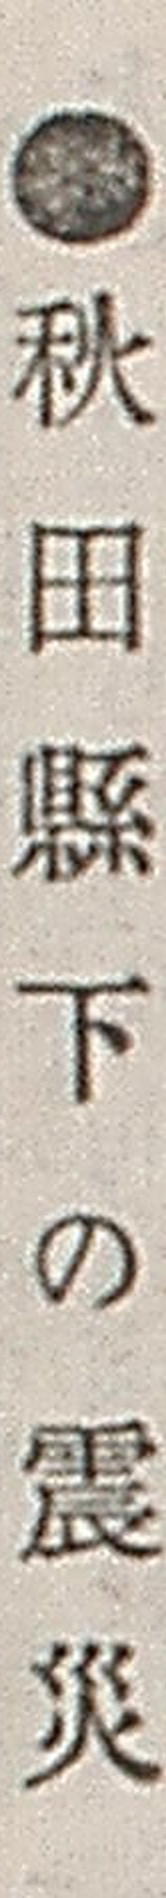●秋田県下の震災
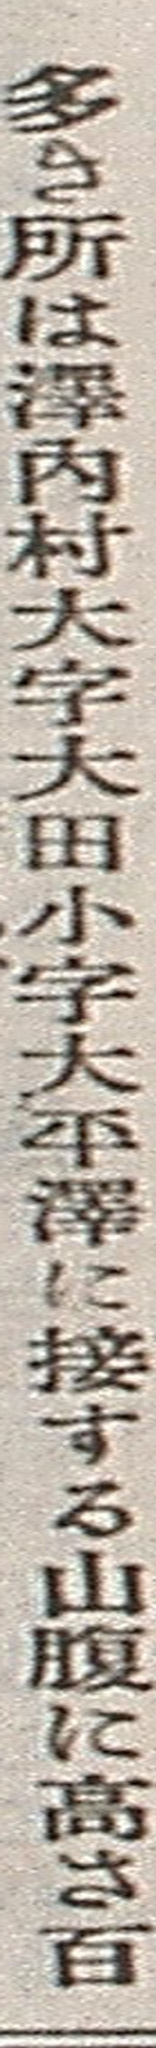多き所は沢内村大字大田小字大平沢に接する山腹に高さ百
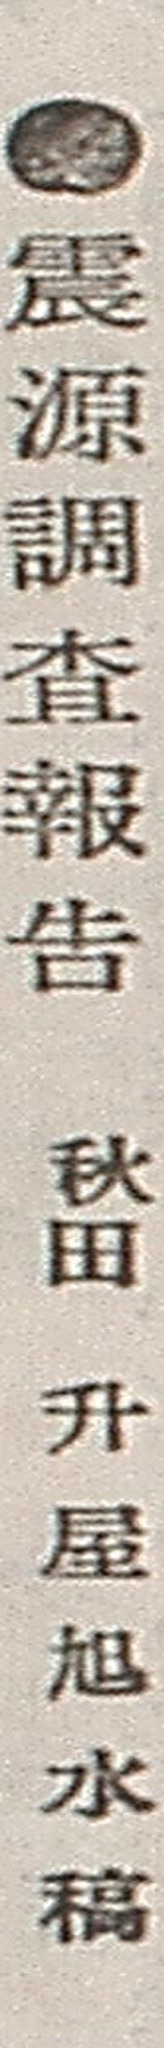●震源調査報告秋田升屋旭水稿
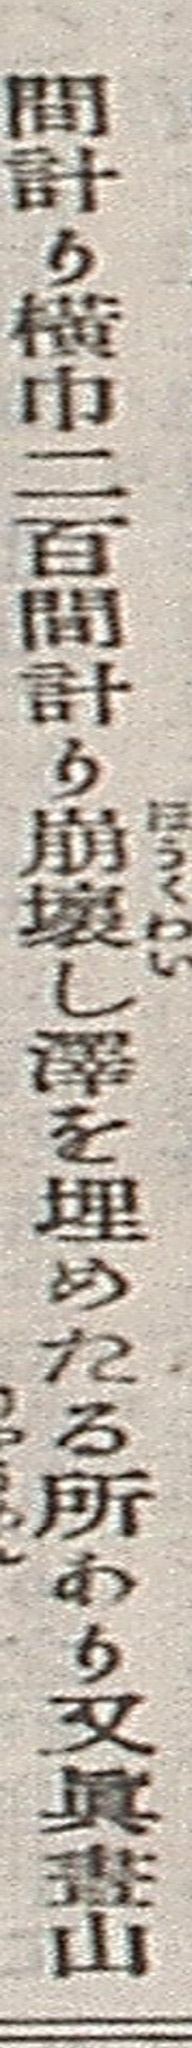間計り横巾二百間計り崩壊し沢を埋めたる所あり又真昼山
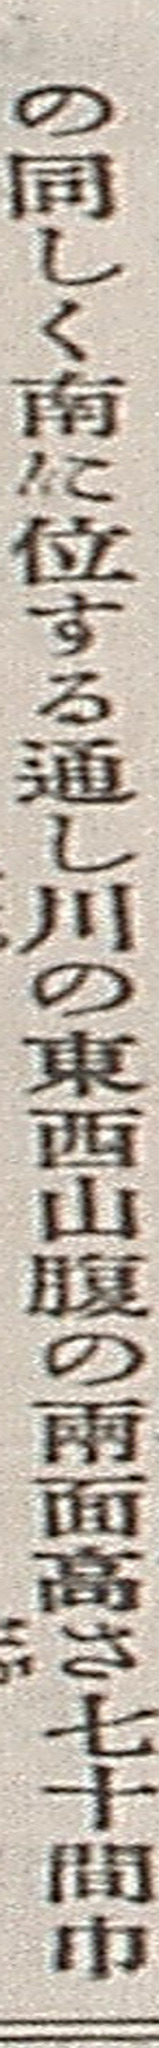の同しく南に位する通し川の東西山腹の両面高さ七十間巾
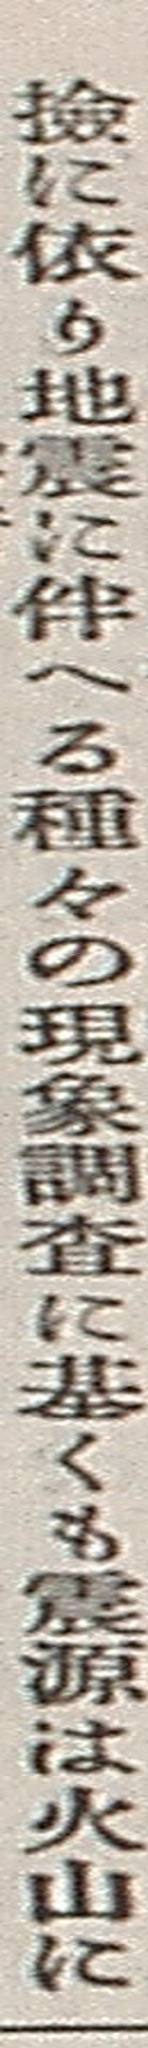撿に依り地震に伴へる種々の現象調査に基くも震源は火山に
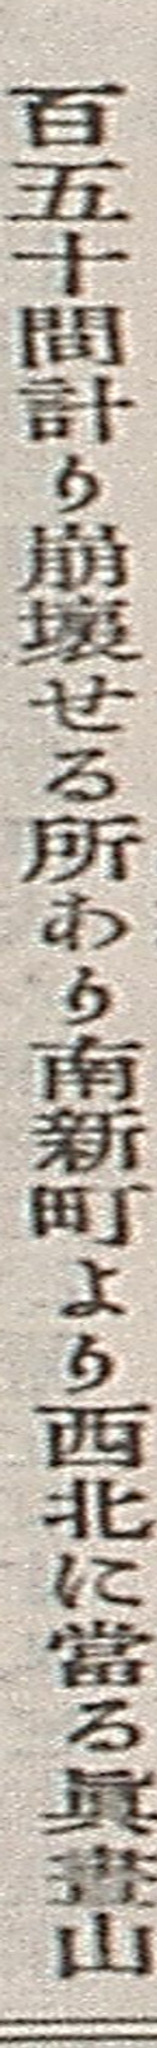百五十間計り崩壊せる所あり南新町より西北に当る真昼山
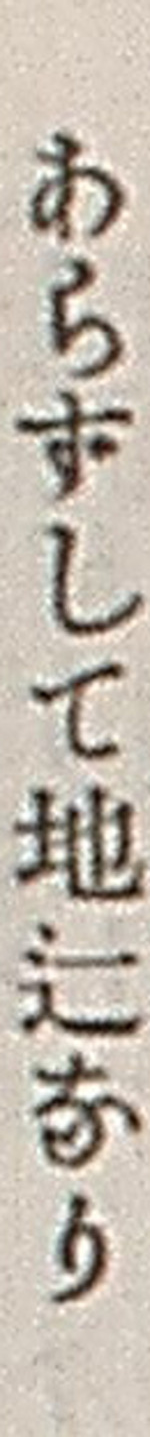あらずして地辷なり
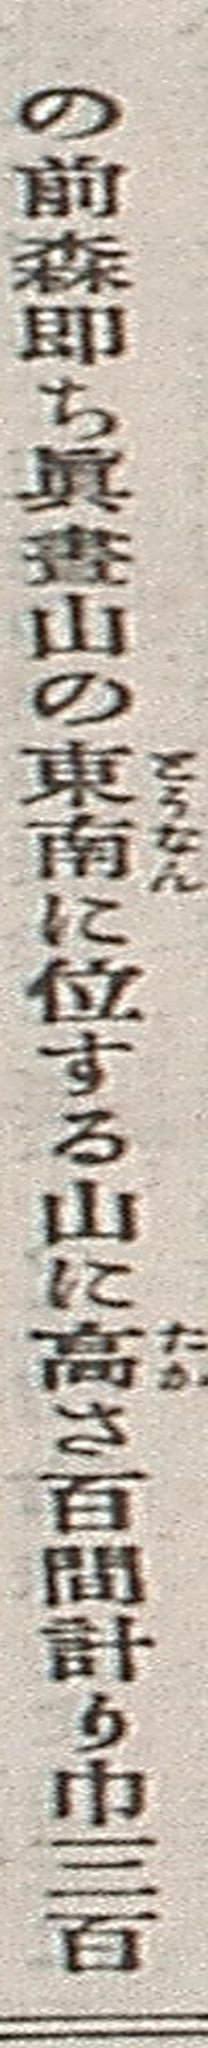の前森即ち真昼山の東南に位する山に高さ百間計り巾三百

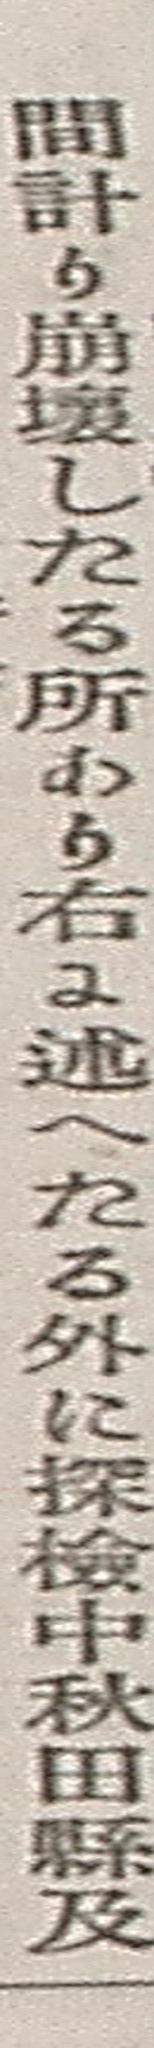間計り崩壊したる所あり右に述へたる外に探検中秋田県及
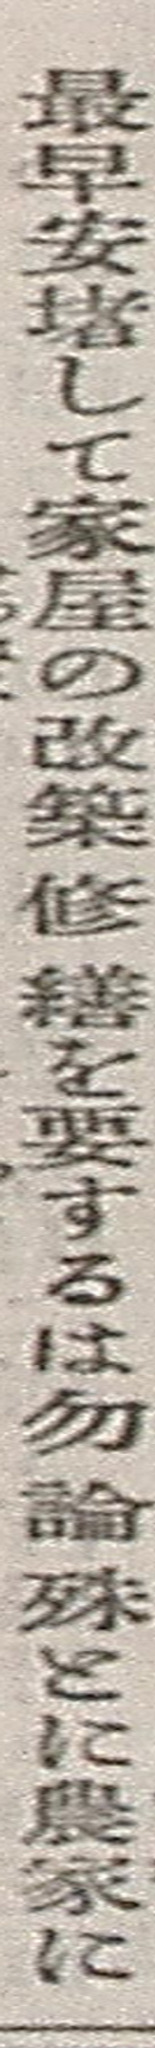最早安堵して家屋の改築修繕を要するは勿論殊とに農家に
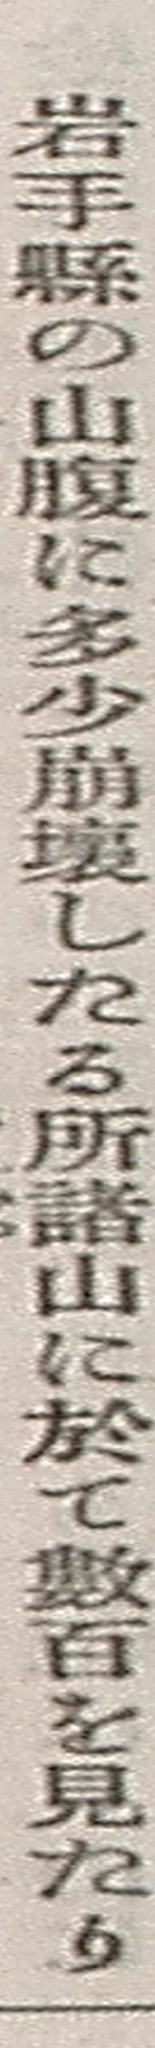岩手県の山腹に多少崩壊したる処諸山に於て数百を見たり
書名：風俗畫報臨時増刊第百二十四號　洪水地震被害録（上）
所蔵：東京大学地震研究所図書室 Earthquake Research Institute Library, The University of Tokyo, JAPAN
